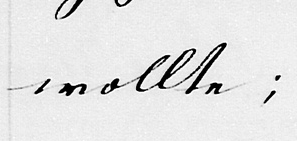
wollte;
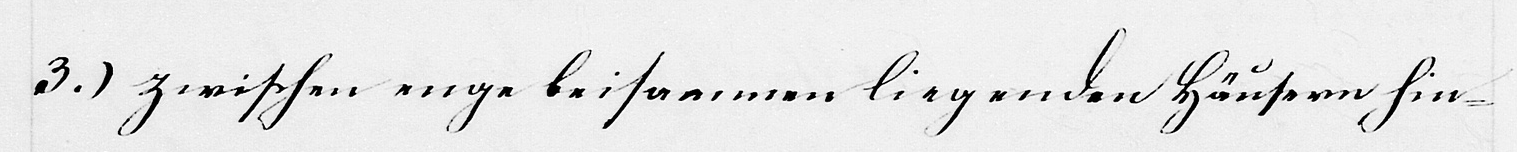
3.) zwischen enge beisammen liegenden Häusern hin¬
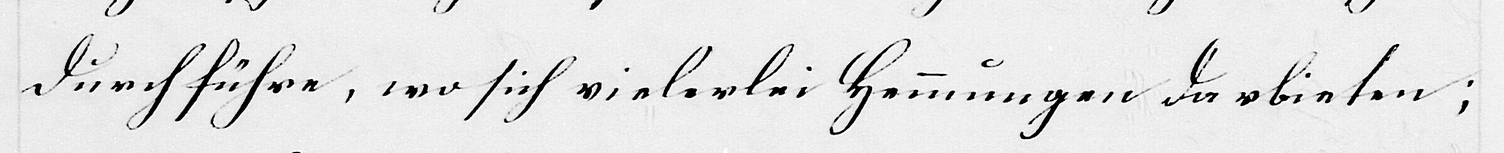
durch führe, wo sich vielerlei Hemmungen darbieten;
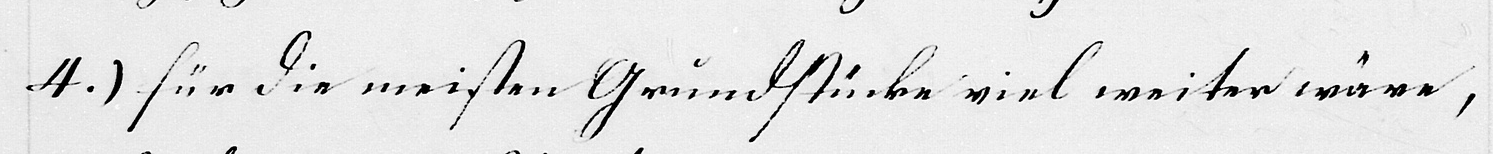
4.) für die meisten Grundstücke viel weiter wäre,
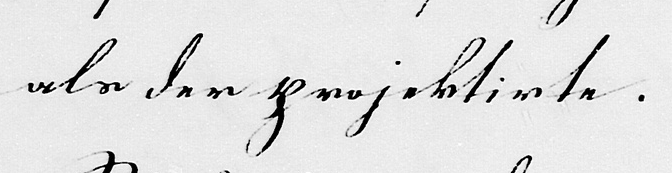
als der projektirte.
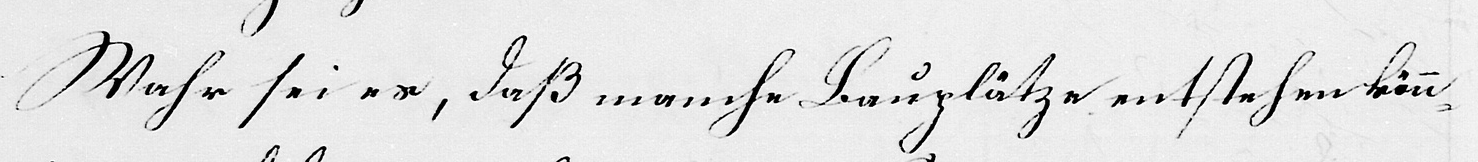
Wahr sei es, daß manche Bauplätze entstehen könn¬
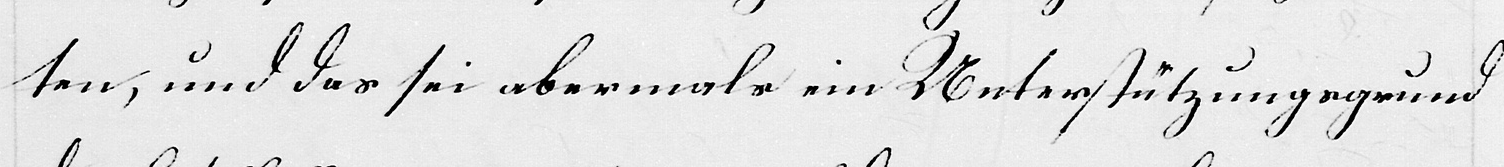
ten, und das sei abermals ein Unterstützungsgrund
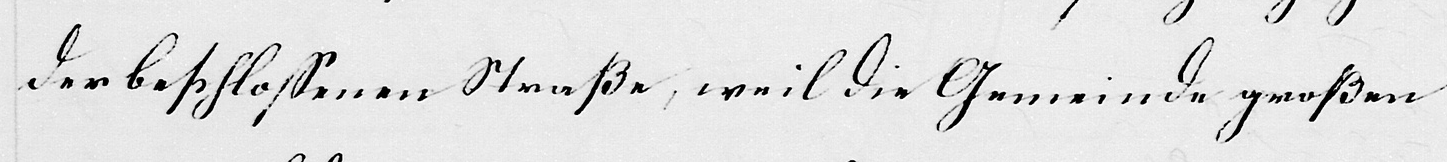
der beschloßenen Straße, weil die Gemeinde großen
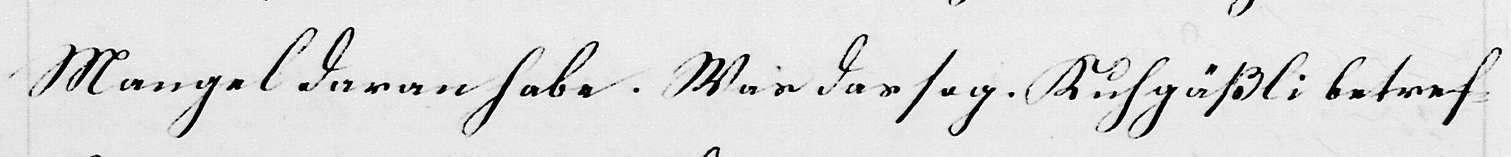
Mangel daran habe. Was das sog. Kuhgäßli betref¬
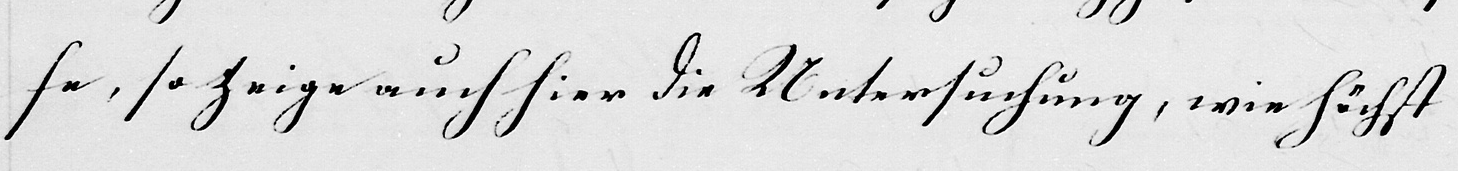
fe, so zeige auch hier die Untersuchung, wie höchst
